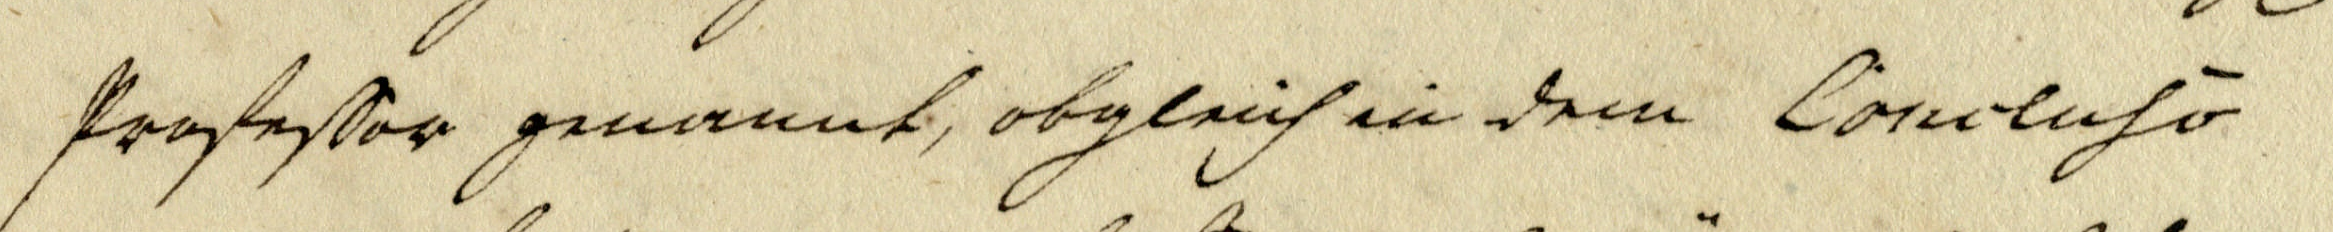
Professor genannt, obgleich in dem Concluso
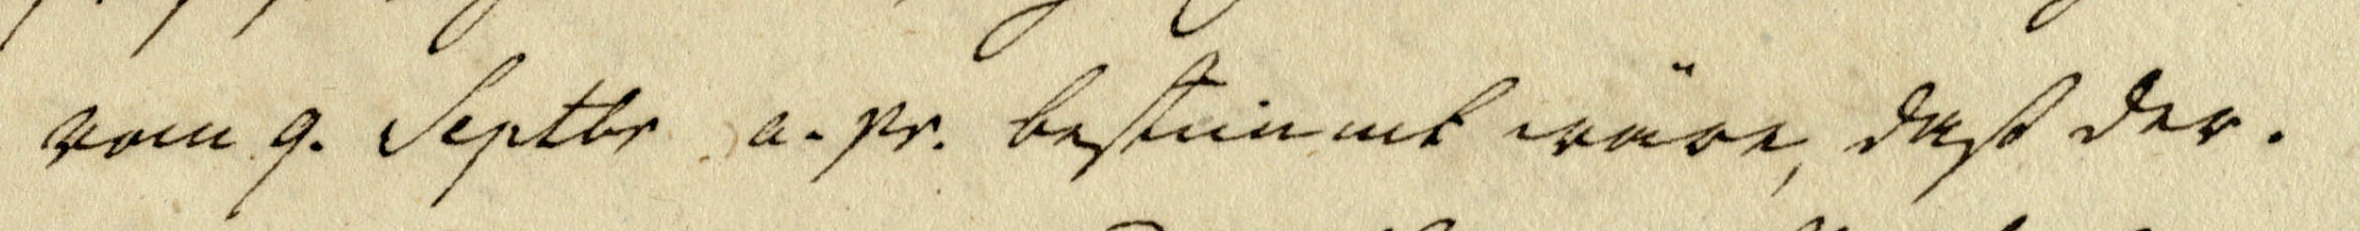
vom 9. Septbr. a. pr. bestimmt wäre, daß der¬
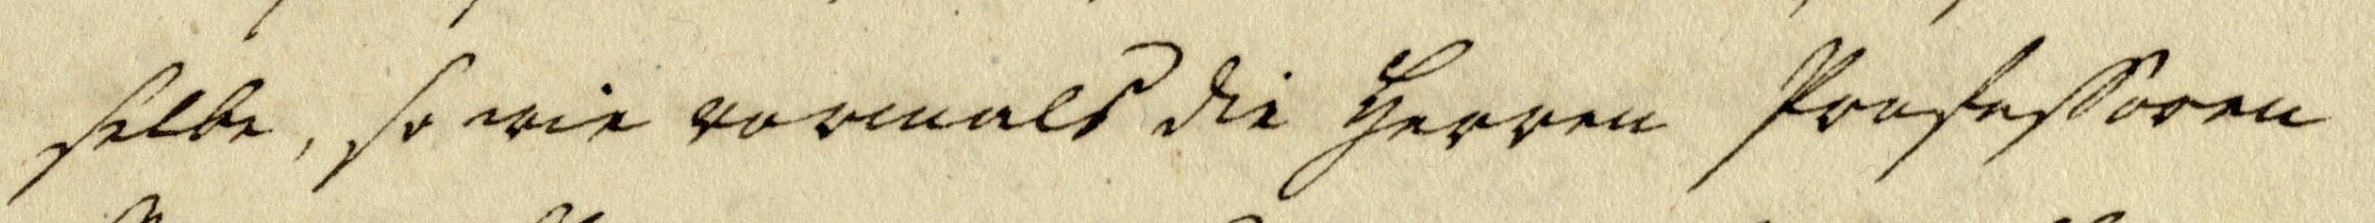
selbe, so wie vormals die Herren Professoren
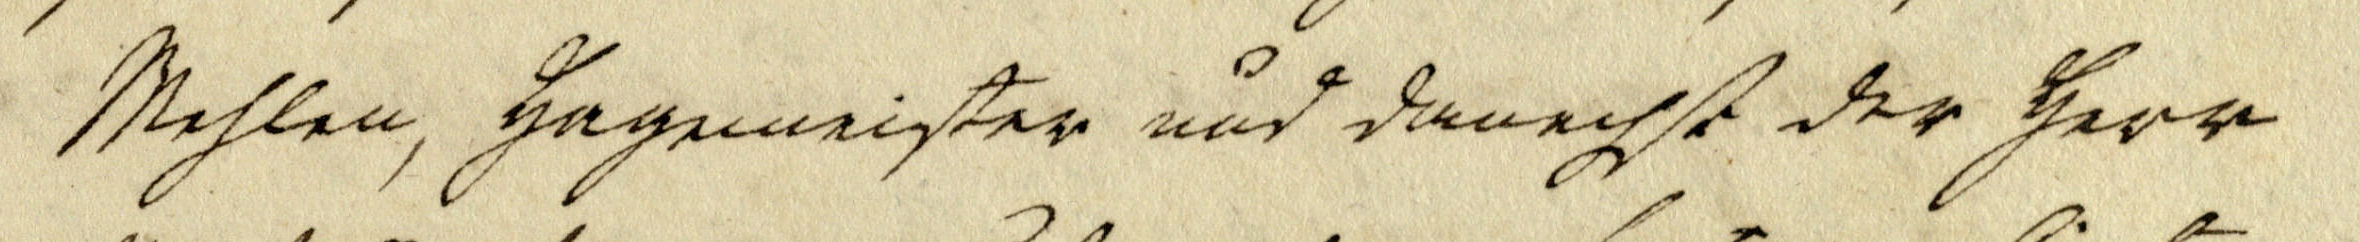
Mehlen, Hagemeister und danechst der Herr
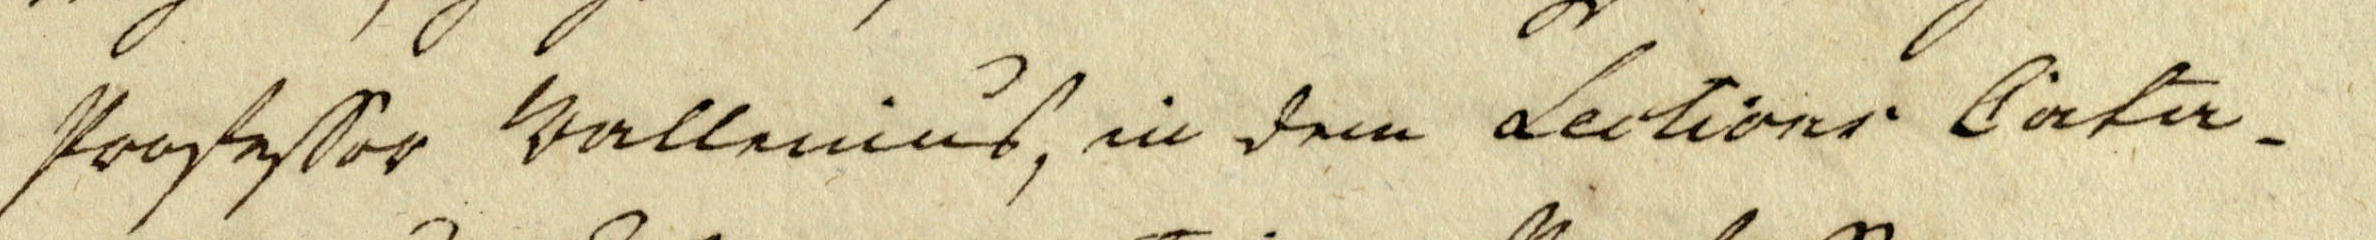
Professor Wallenius, in dem Lections Cata¬
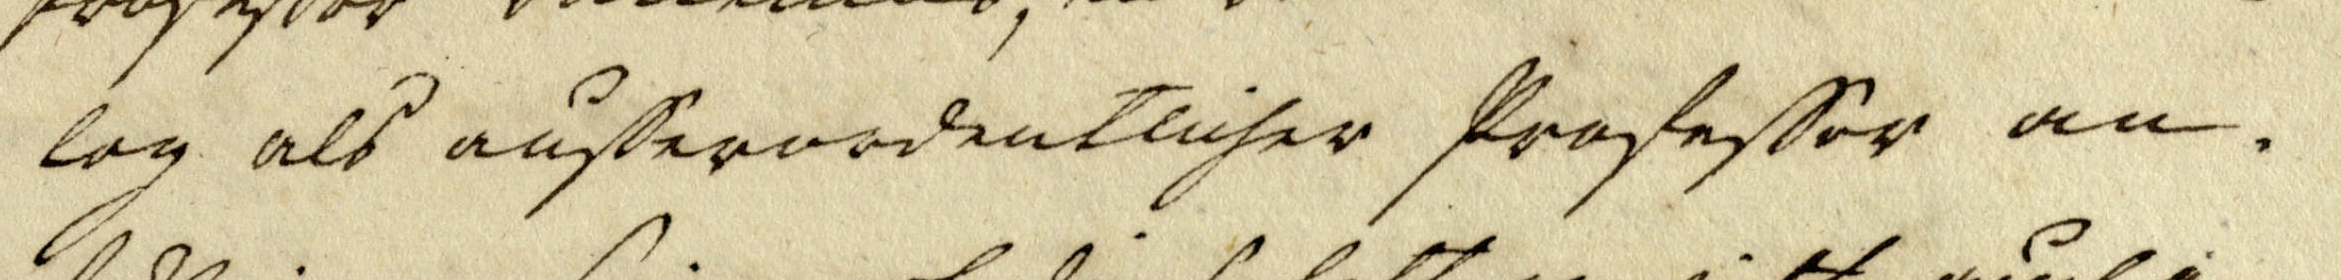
log als außerordentlicher Professor an¬
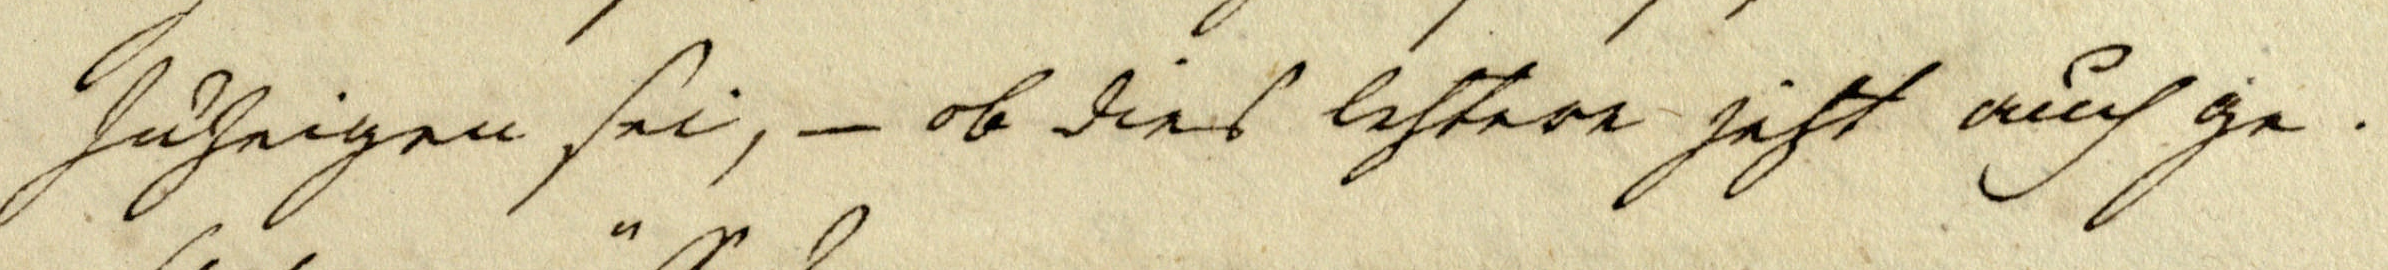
zuzeigen sei, ob dies letztere jetzt auch ge¬
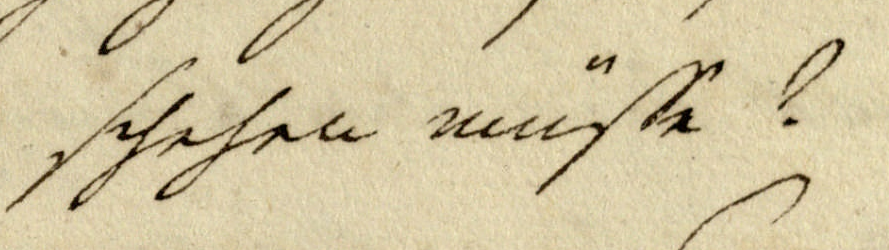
schehen müsse ?
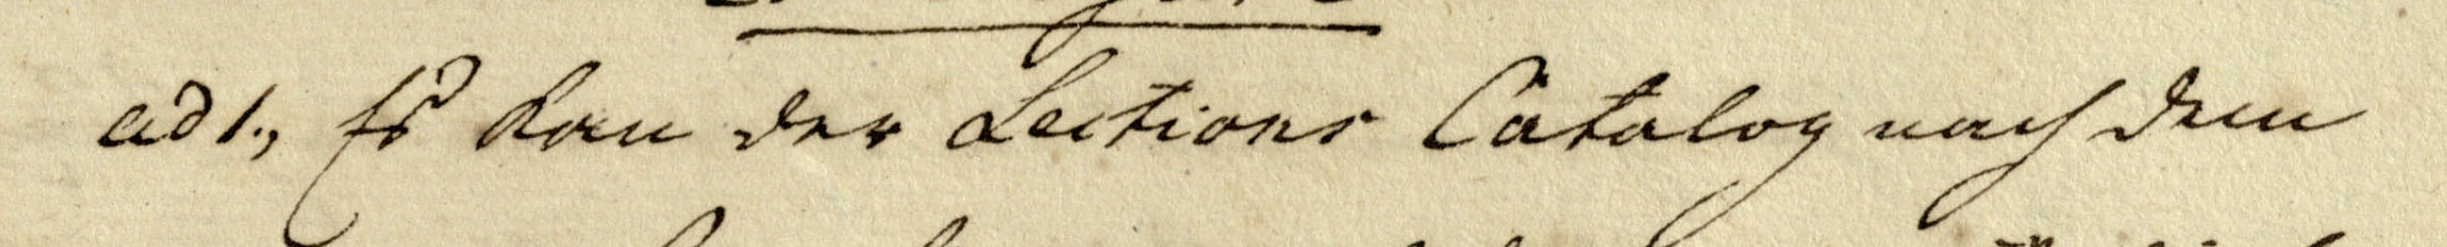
ad 1., Es kan der Lections Catalog nach dem
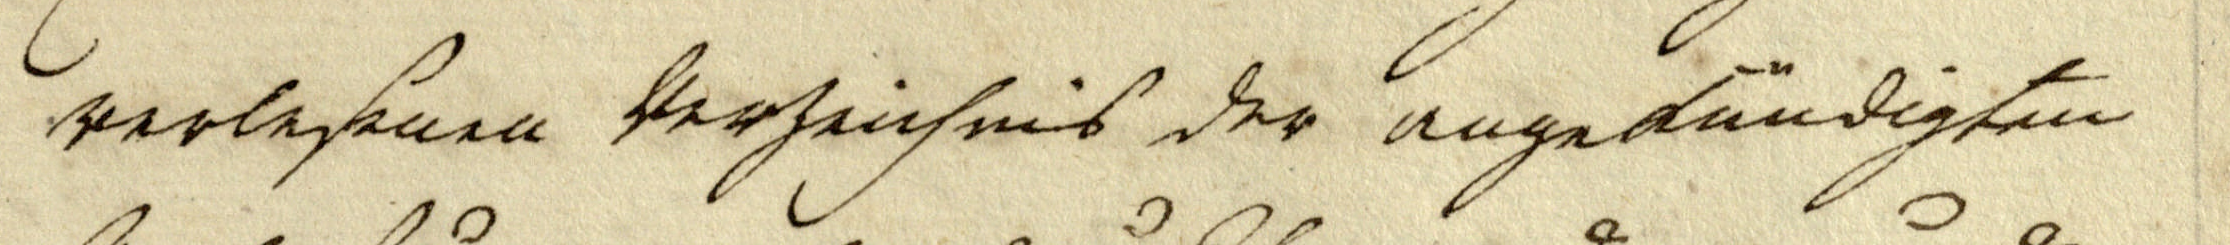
verlesenen Verzeichnis der angekündigten
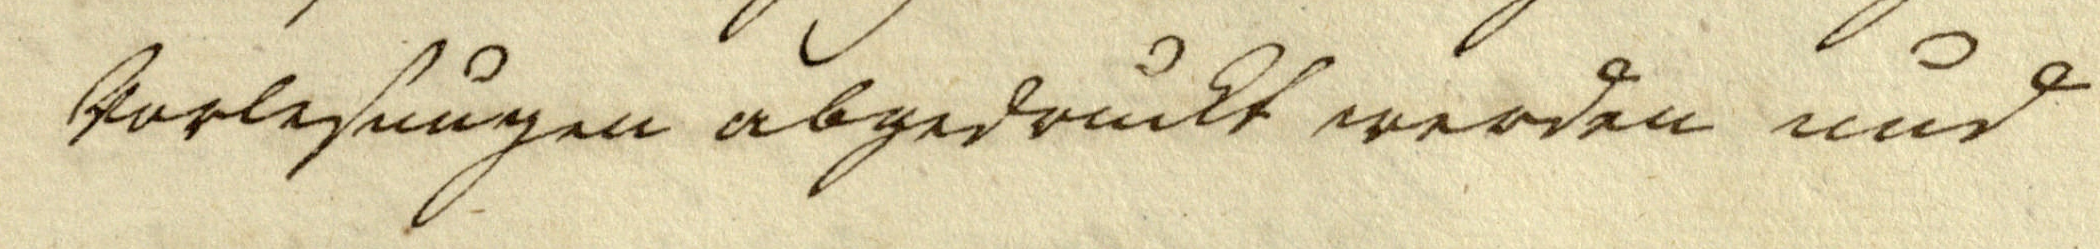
Vorlesungen abgedruckt werden und
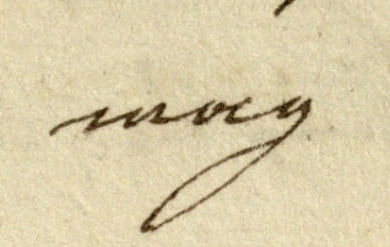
mag
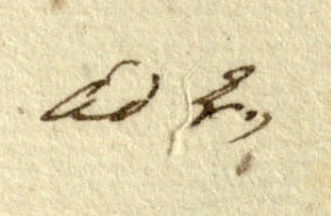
ad 2.,
